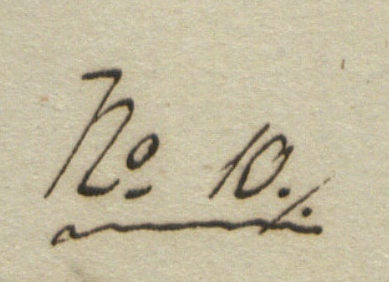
No 10.
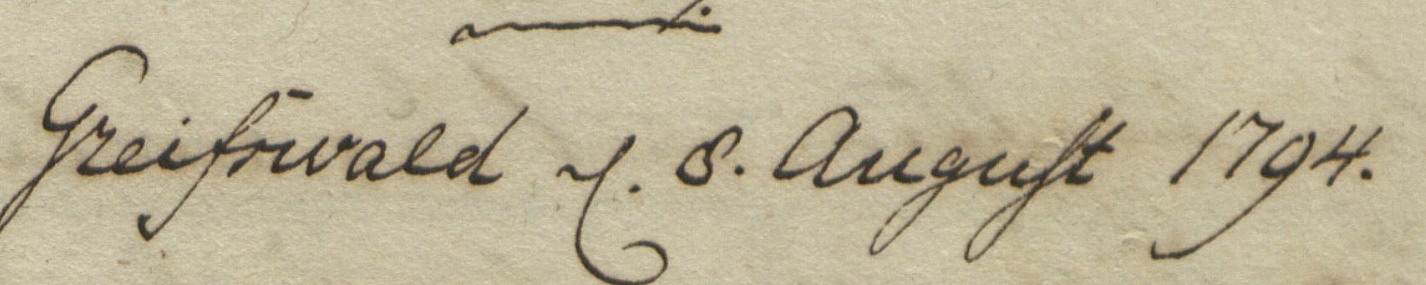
Greifswald d. 8. Angust 1794.
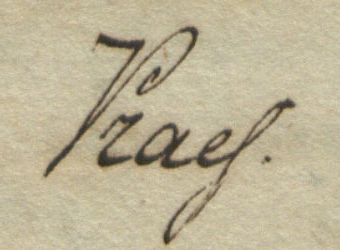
Praes.
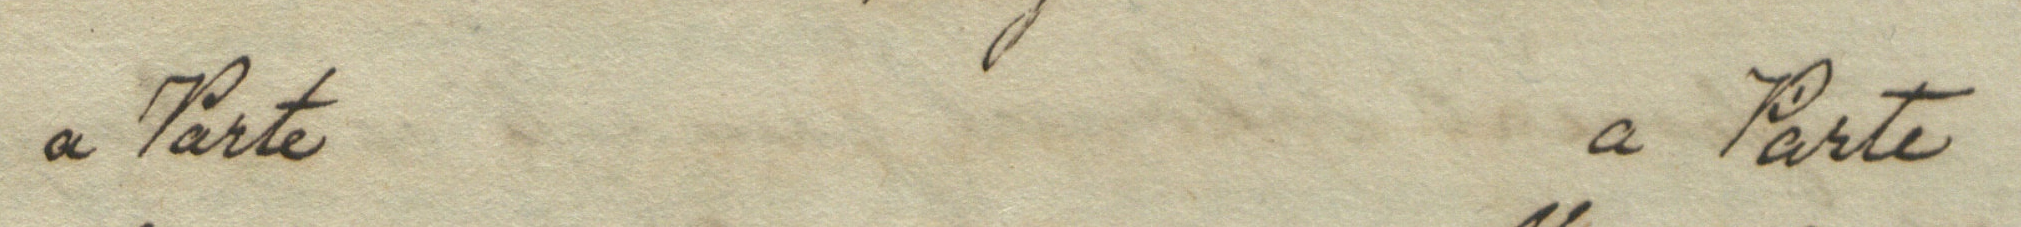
a Parte a Parte
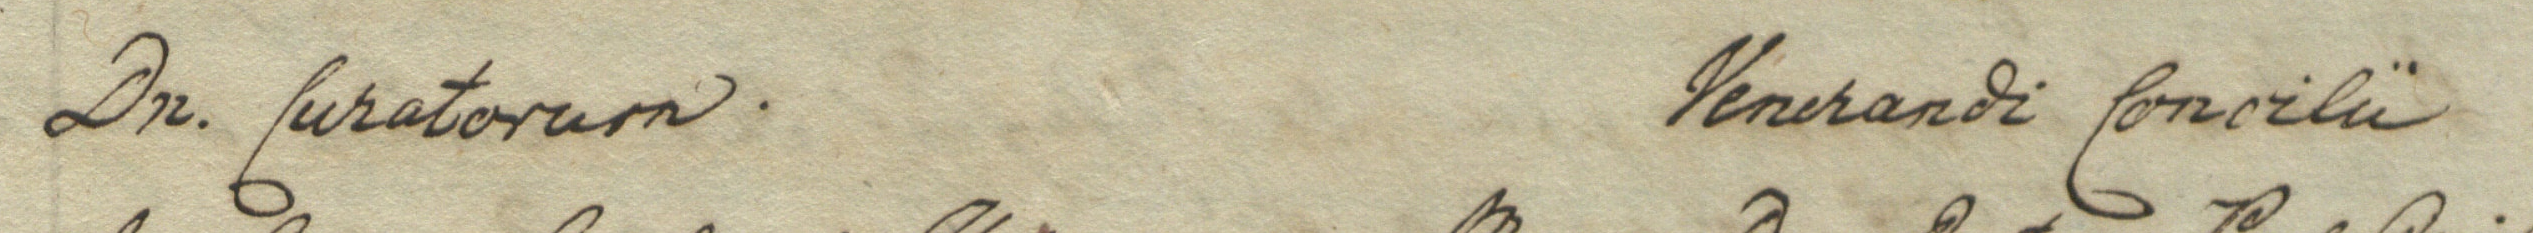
Dn. Curatorum. Venerandi Concilii
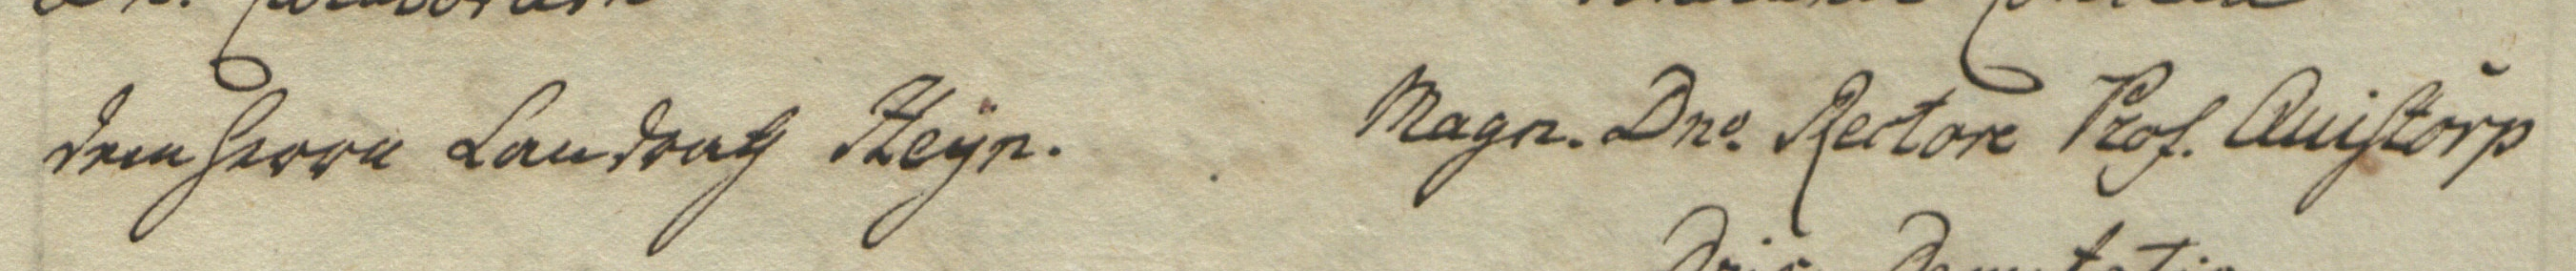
dem Herrn Landrath Heÿn. Magn. Dn. Rectore Prof. Quistorp
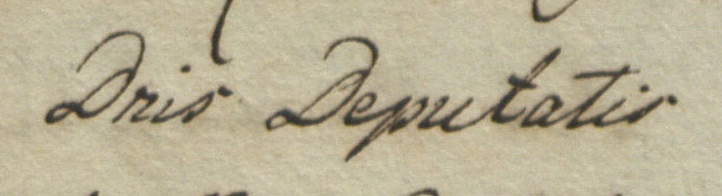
Dnis Deputatis
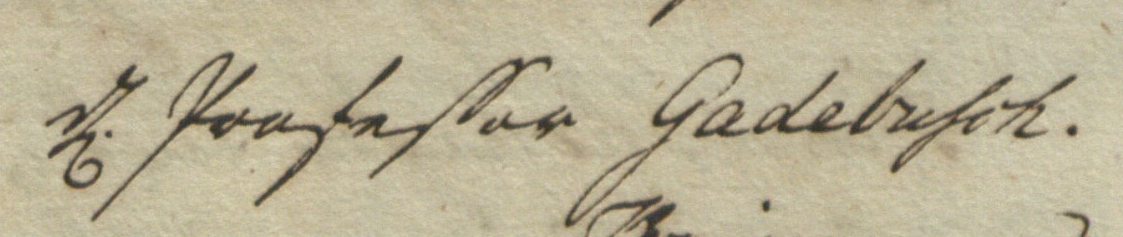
dh. Professor Gadebusch.
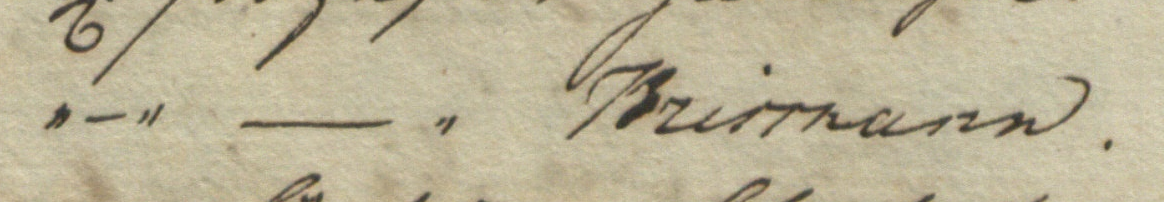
Brismann.
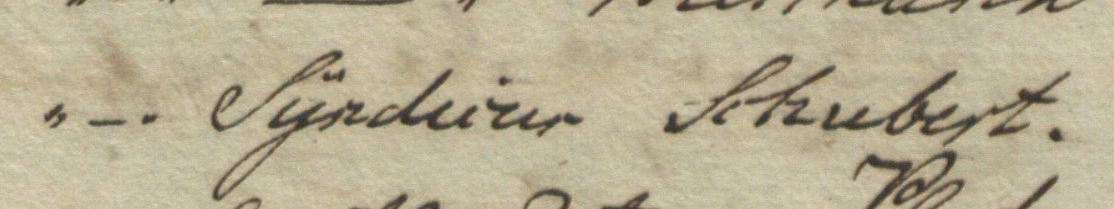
Sÿndicus Schubert.
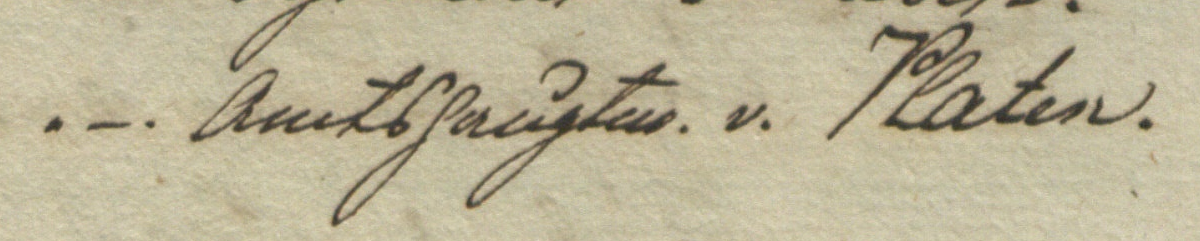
Amtshauptm. v. Platen.
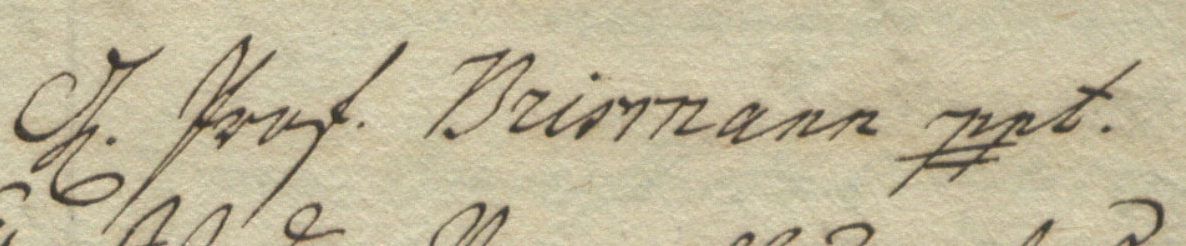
dh. Prof. Brismann ppt.
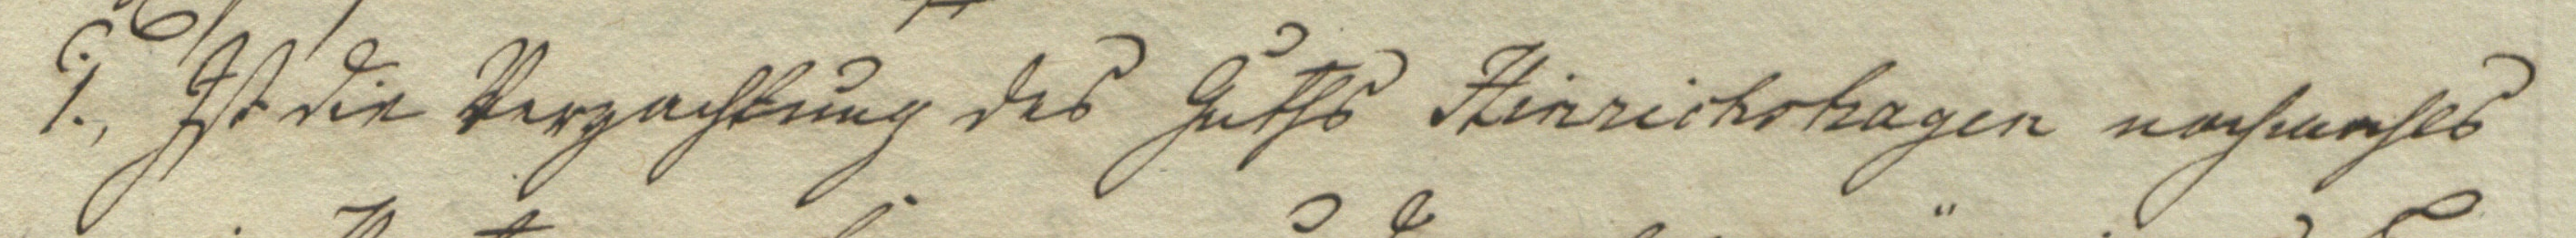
1., Ist die Verpachtung des Guths Hinrichshagen nochmahls
